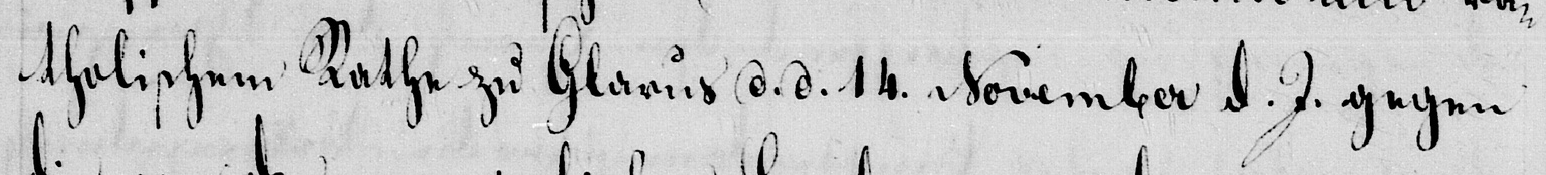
tholischem Rathe zu Glarus d. d. 14. November d. J. gegen
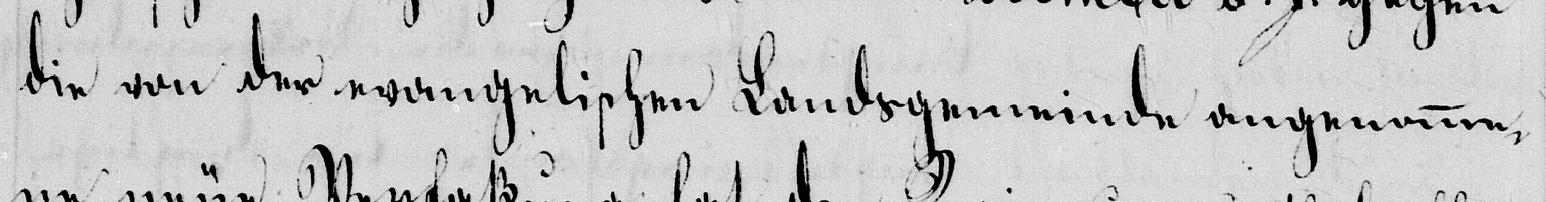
die von der evangelischen Landsgemeinde angenomme¬
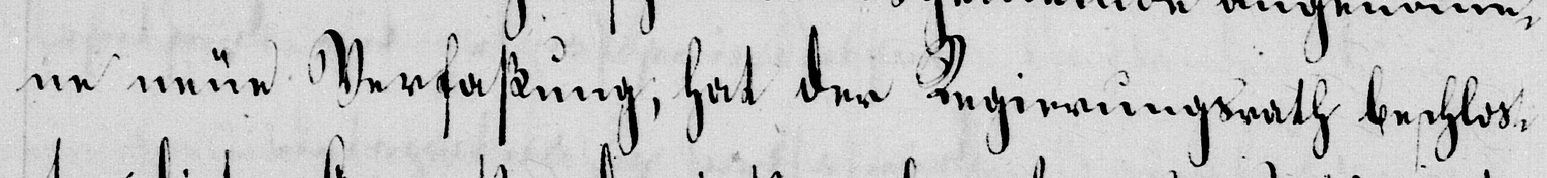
ne neue Verfaßung, hat der Regierungsrath beschlo¬
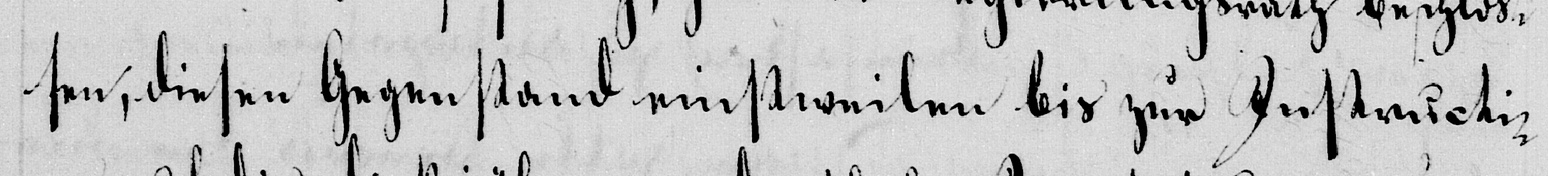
ßen, diesen Gegenstand einstweilen bis zur Instructi¬
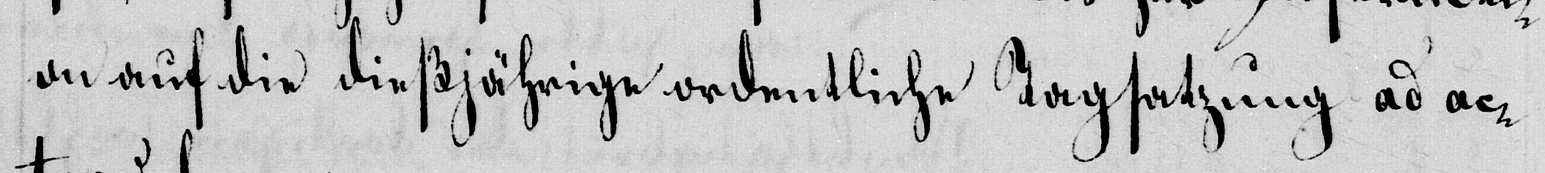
on auf die dießjährige ordentliche Tagsatzung ad ac¬
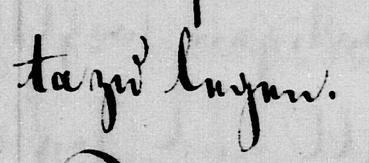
ta zu legen.
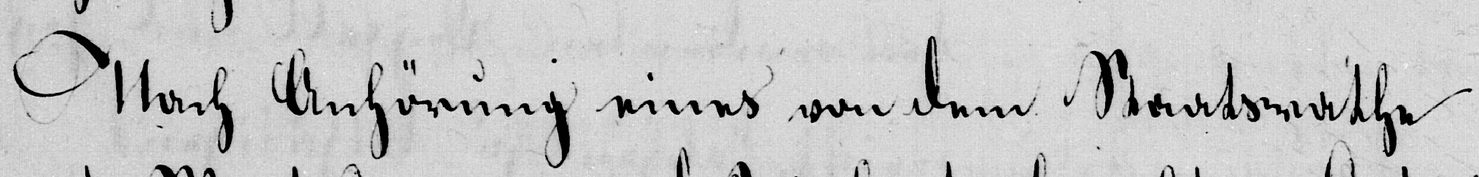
Nach Anhörung eines von dem Staatsrathe
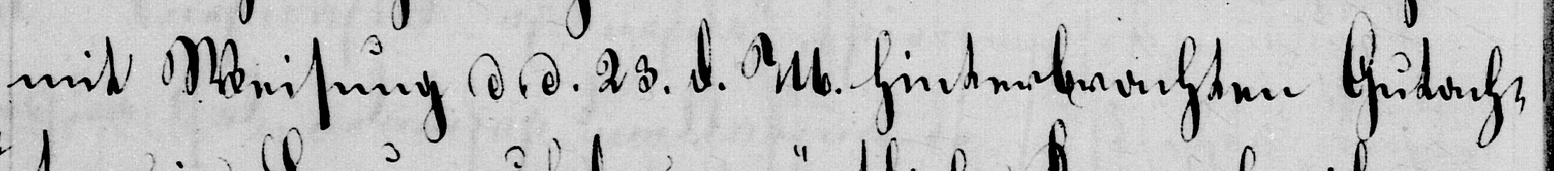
mit Weisung d. d. 23. d. M. hinterbrachten Gutach¬
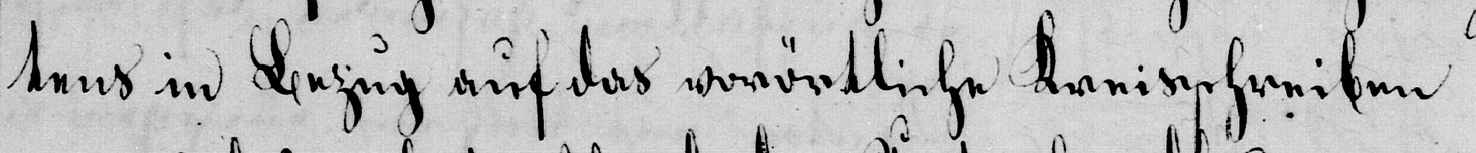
tens in Bezug auf das vorörtliche Kreisschreiben
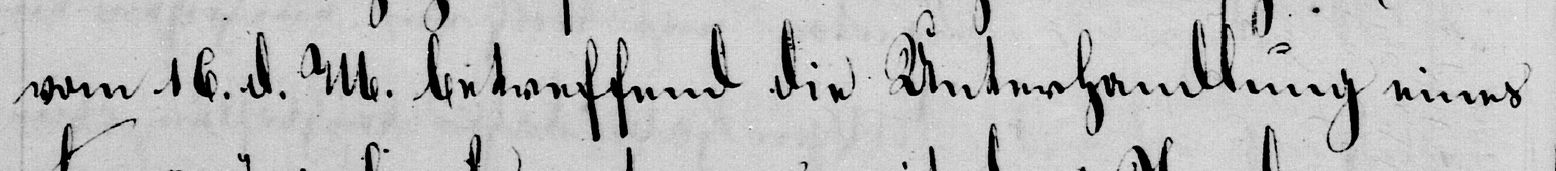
vom 16. d. M. betreffend die Unterhandlung eines
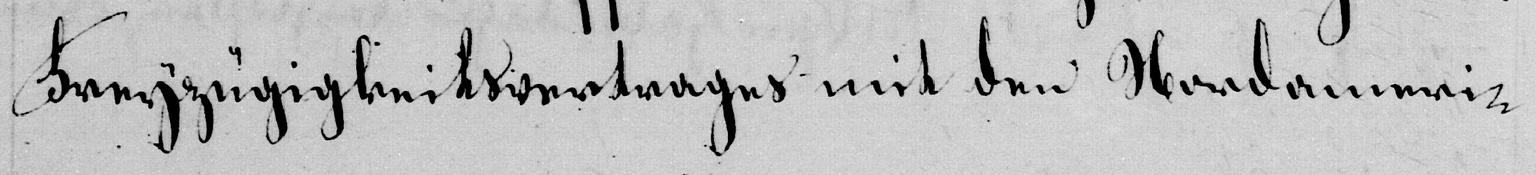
Freyzügigkeitsvertrages mit den Nordameri-
